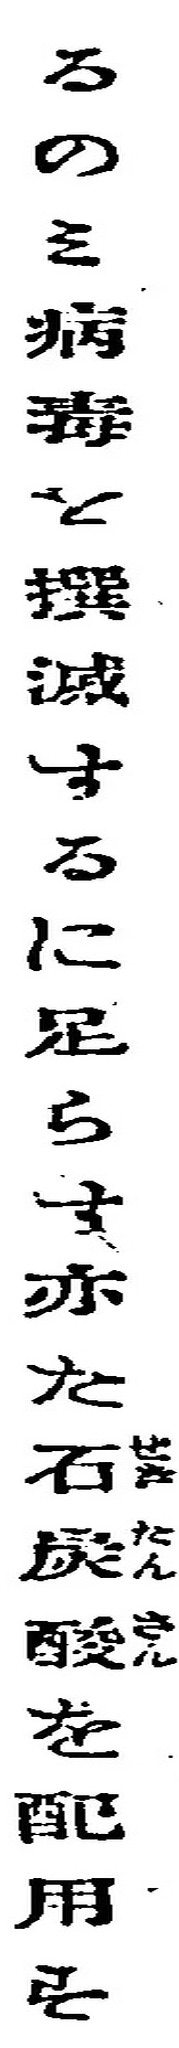るのみ病毒を撰滅するに足らす亦た石炭酸を配用す
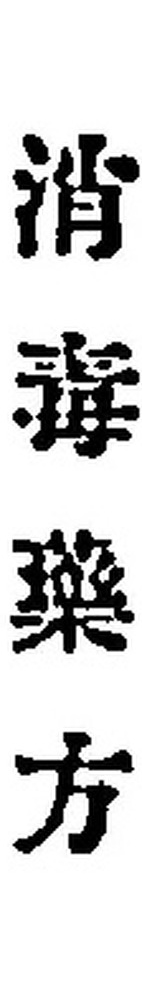消毒薬方
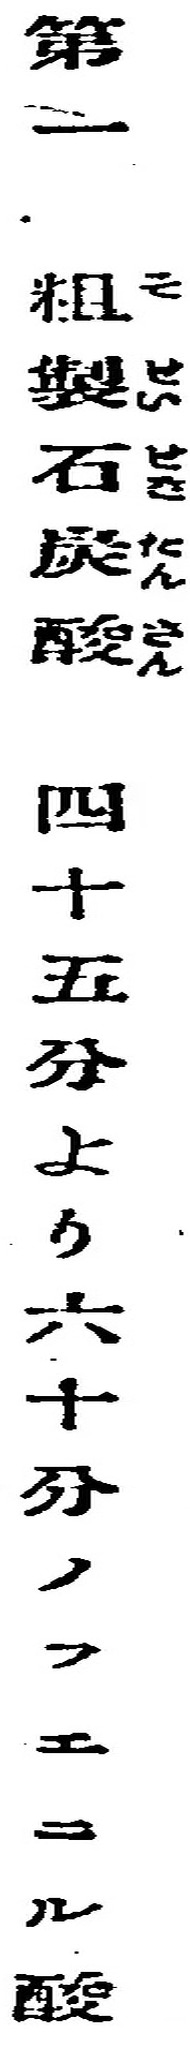第一粗製石炭酸四十五分より六十分ノフエニル酸
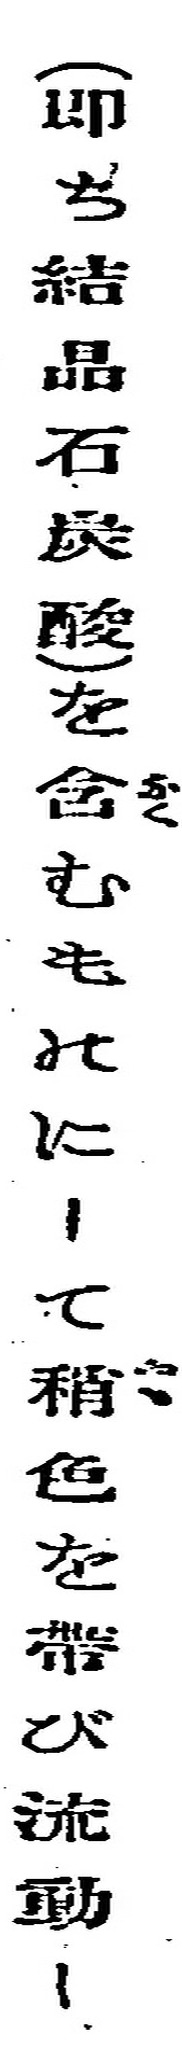(即ち結晶石炭酸)を含むものにして稍色を帯び流動し
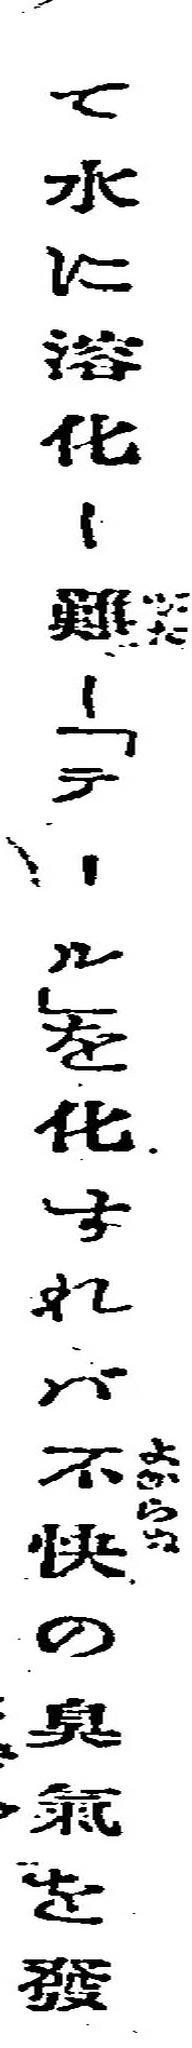て水に溶化し難し「テール」を化すれば不快の臭気を発
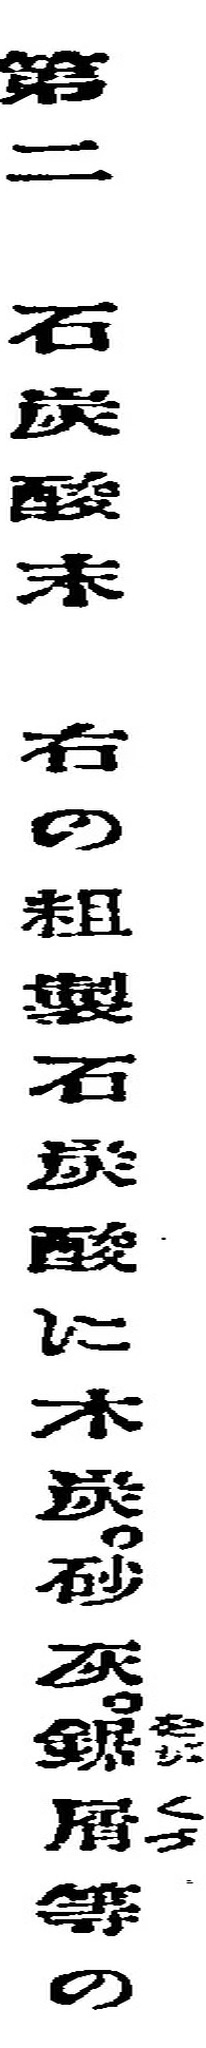第二石炭酸末右の粗製石炭酸に木炭。砂灰。鋸屑等の
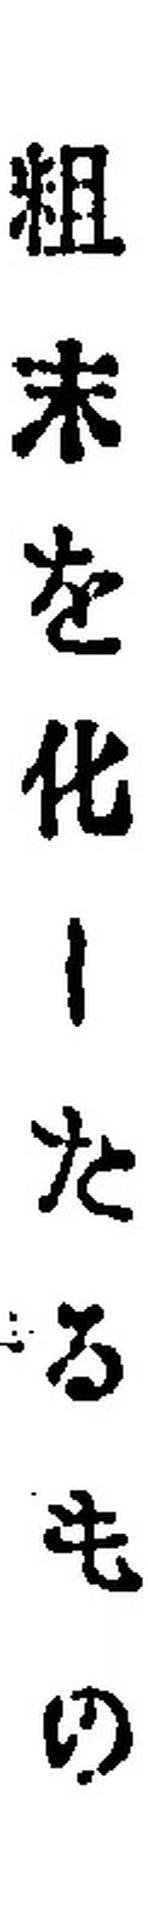粗末を化したるもの
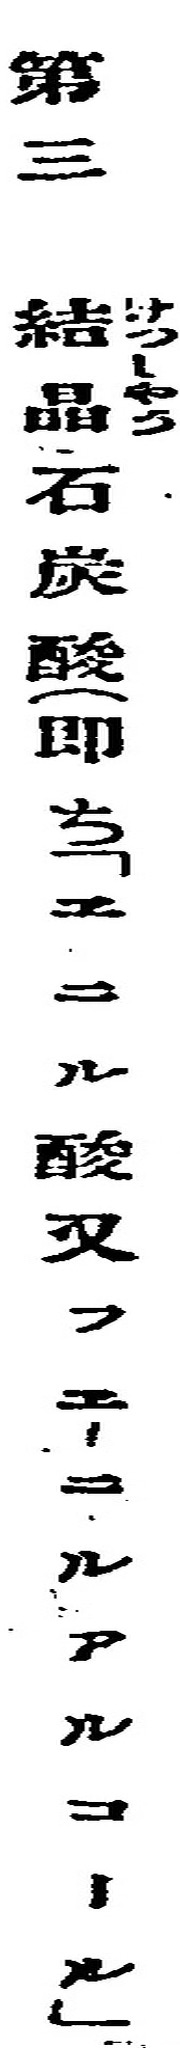第三結晶石炭酸(即ち「ヱニル酸又フヱニルアルコール」
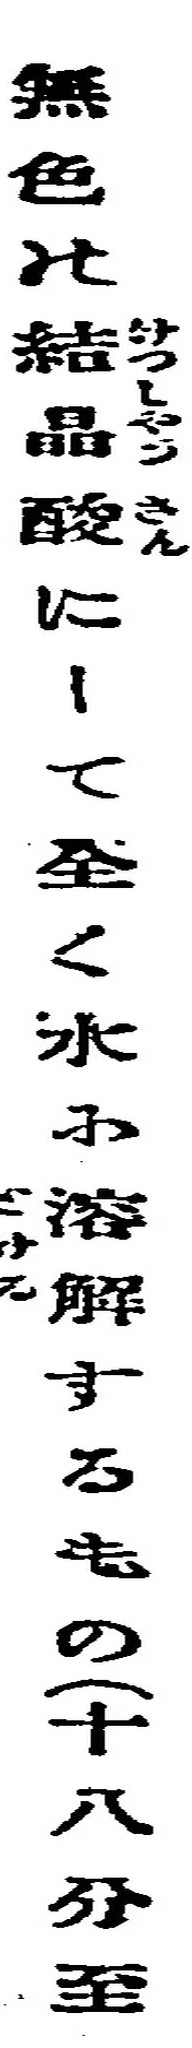無色の結晶酸にして全く水に溶解するもの(十八分至
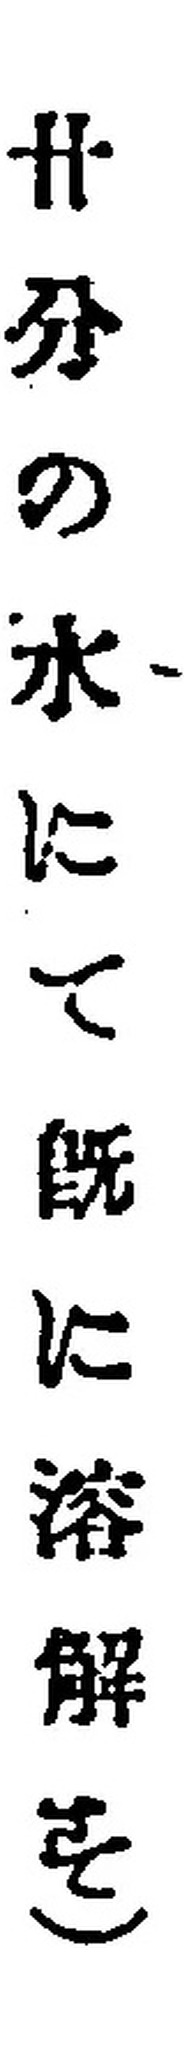廿分の水にて既に溶解す)
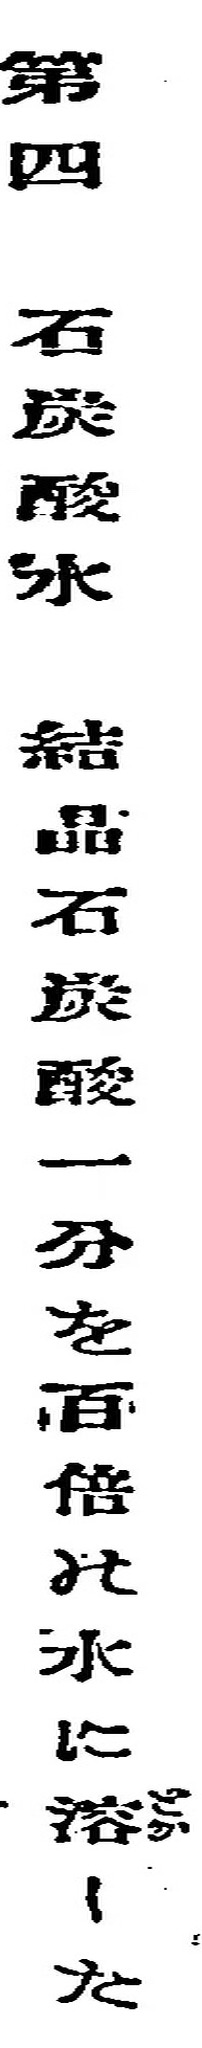第四石炭酸水結晶石炭酸一分を百倍の水に溶した
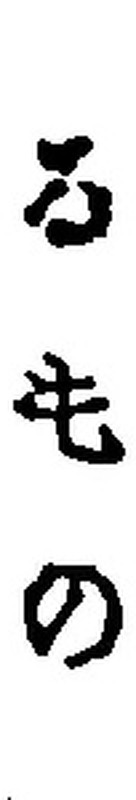るもの
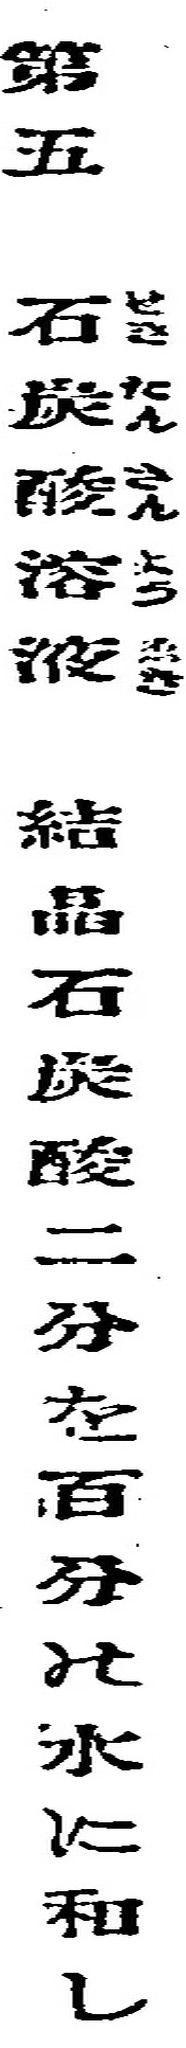第五石炭酸溶液結晶石炭酸二分を百分の水に和し
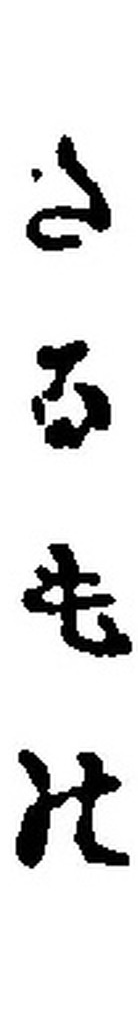たるもの
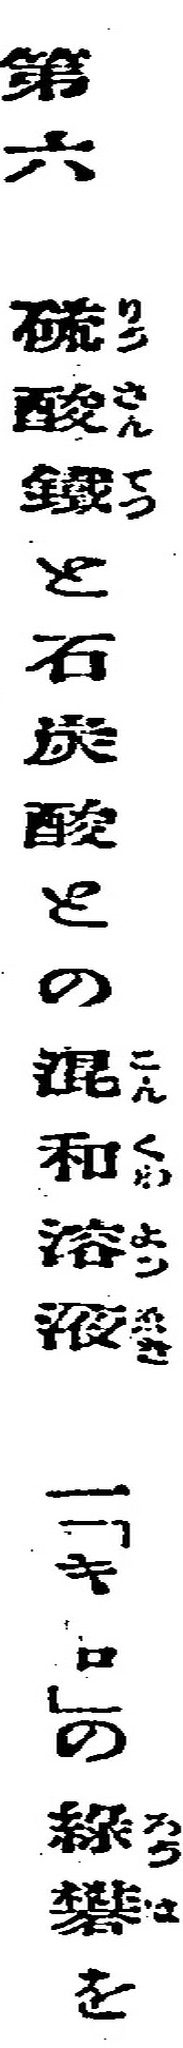第六硫酸鉄と石炭酸との混和溶液一「キロ」の緑礬を

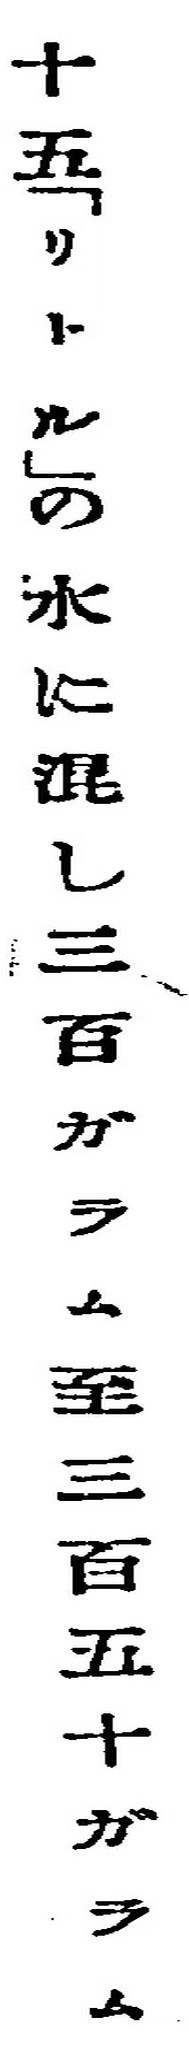十五「リトル」の水に混し三百ガラム至三百五十ガラム
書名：これら病予防心得
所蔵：国立国会図書館 National Diet Library, JAPAN
